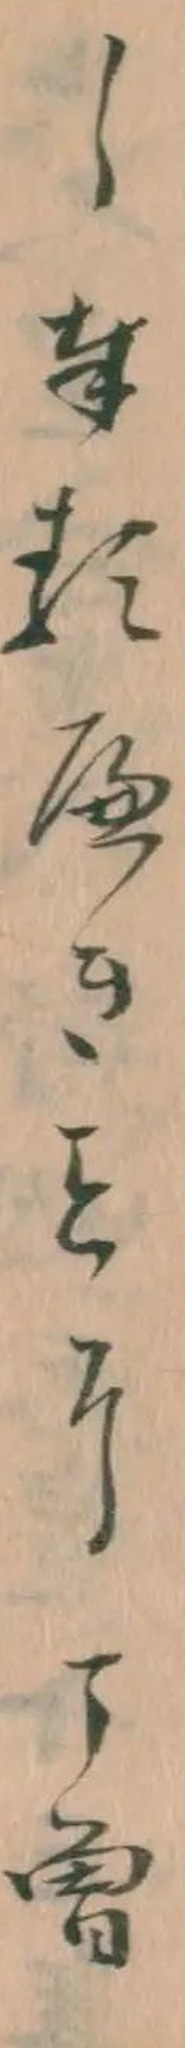し奉るへきことにこそ
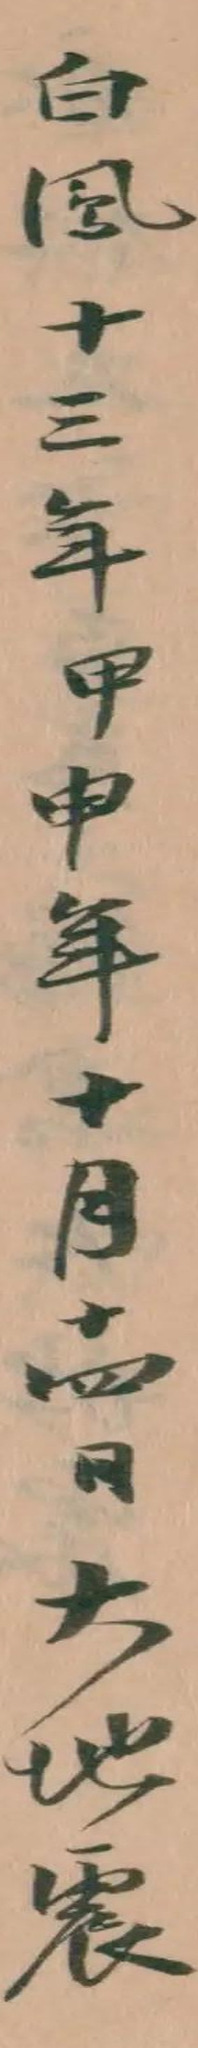白鳳十三甲申年十月十四日大地震
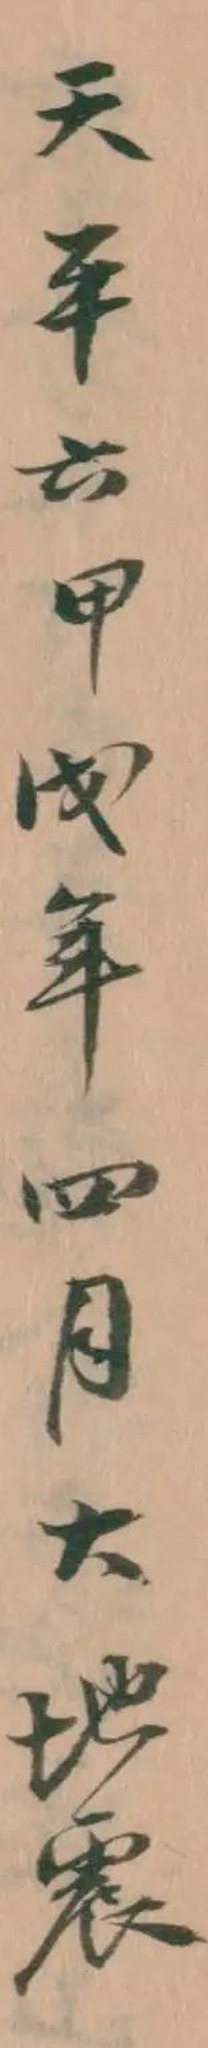天平六甲戌四月大地震
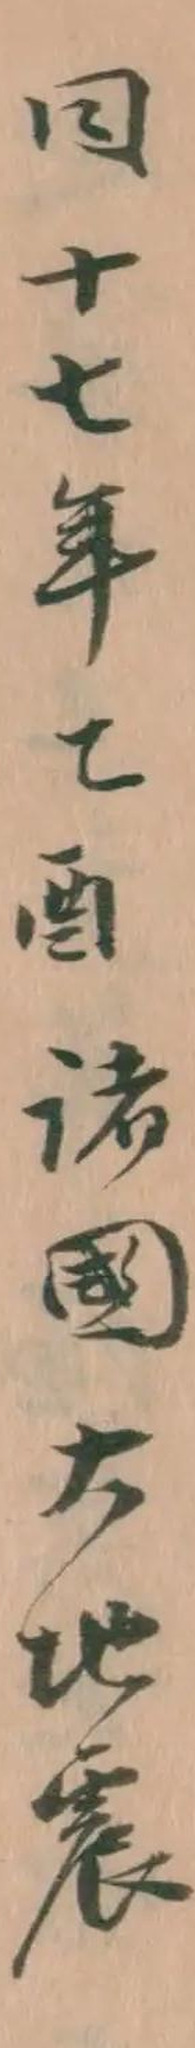同十七乙酉年諸国大地震
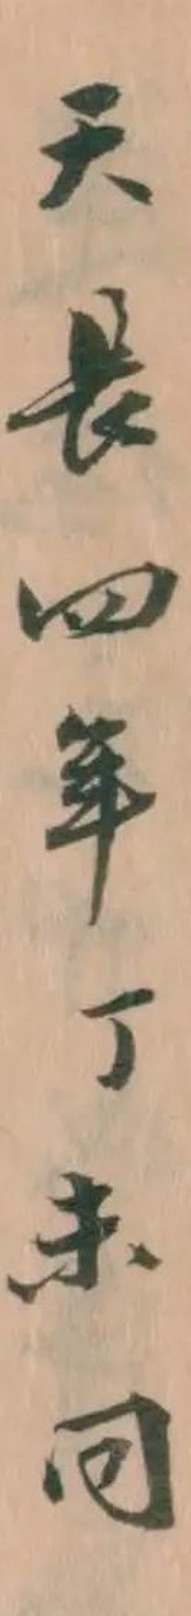天長四丁未年同
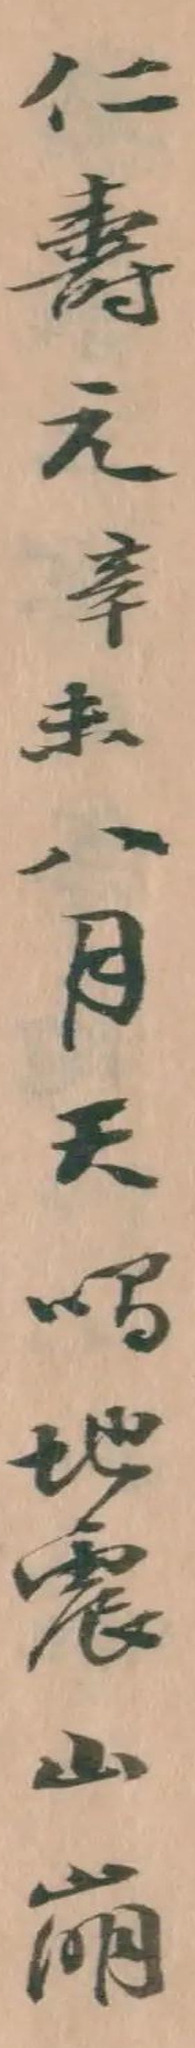仁寿元辛未八月天鳴地震山崩
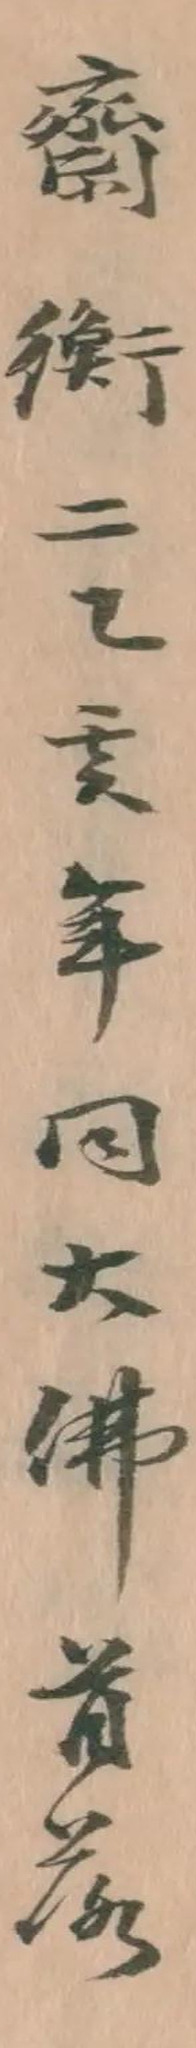齊衡二乙居亥年同大仏首落
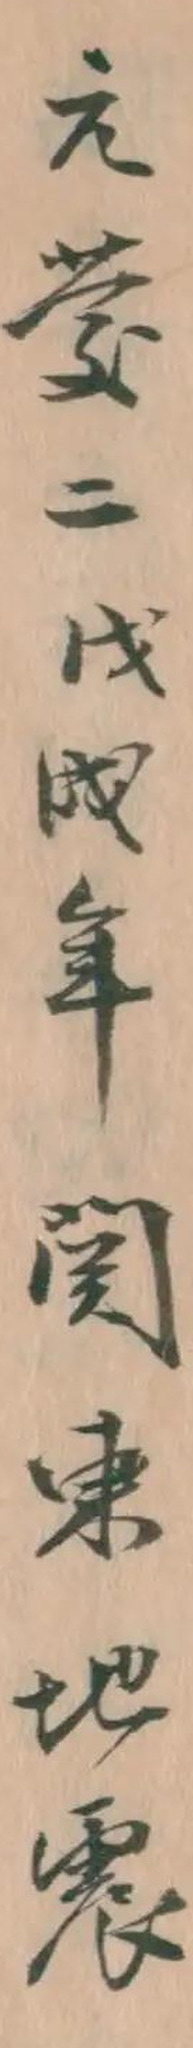元慶二戌戊年関東地震
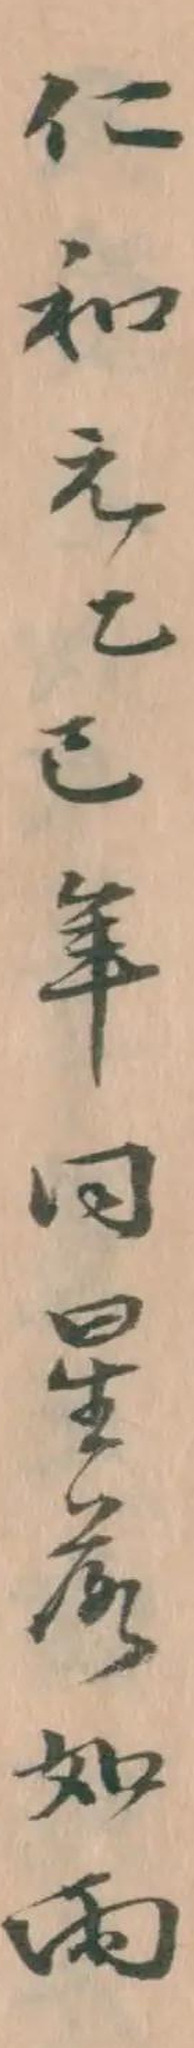仁和元乙己然同星落如雨
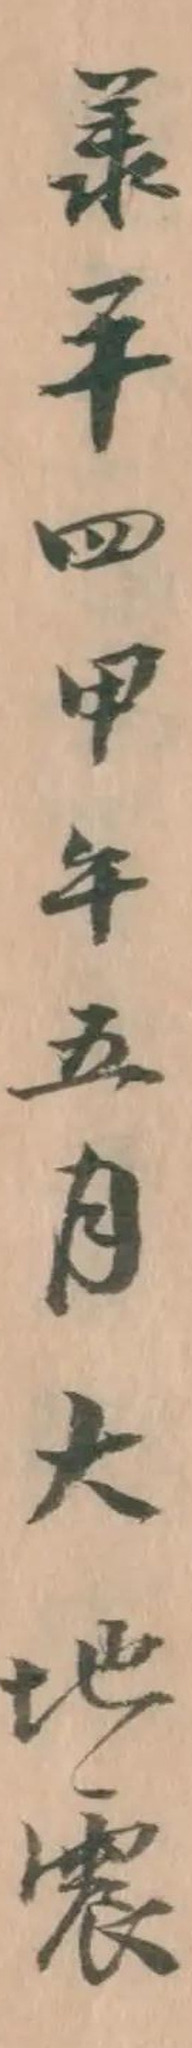承平四甲午五月大地震

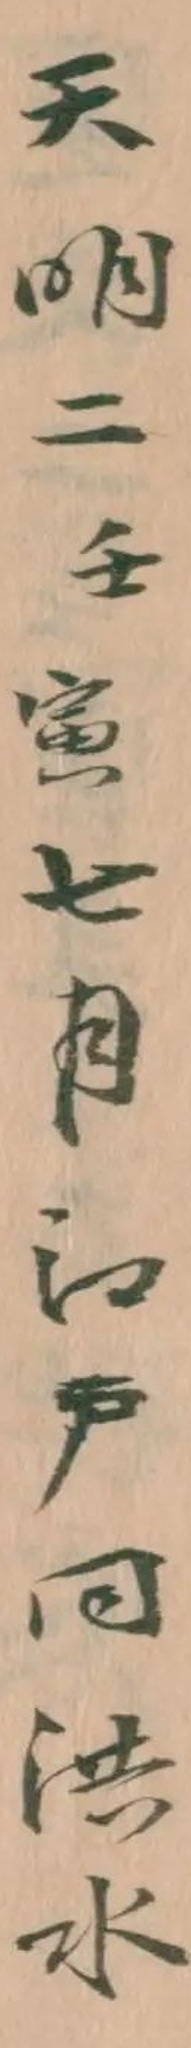天明二壬寅七月江戸同洪水
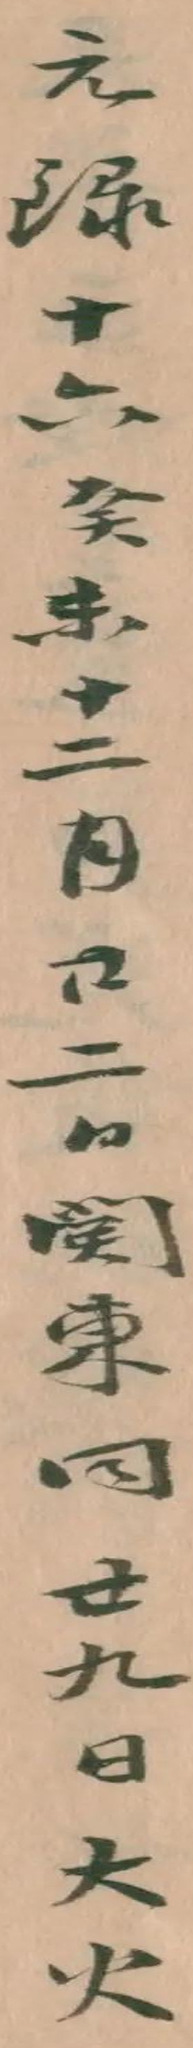元禄十六癸未十二月廿二日関東同廿九日大火
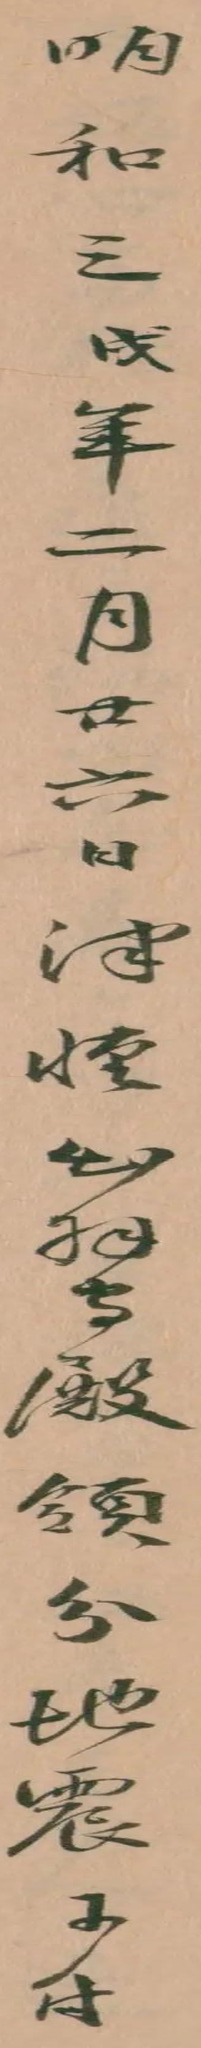明和三戌年二月廿六日津軽出羽守殿領分地震二付
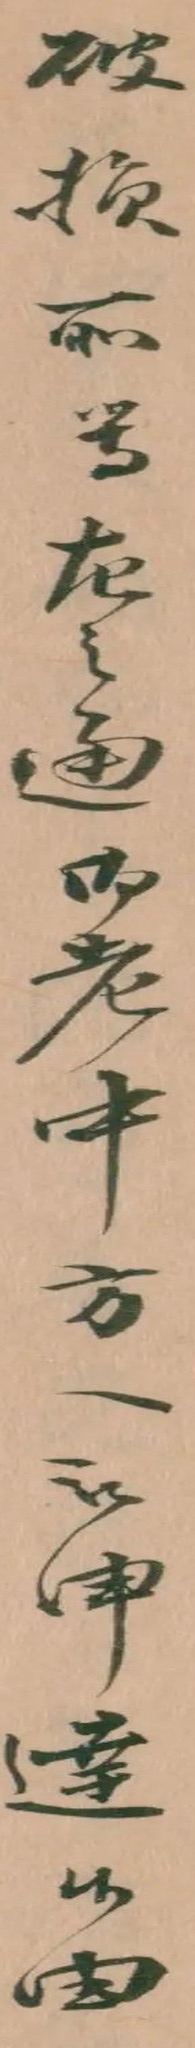破損所等左之通御老中方へ被申達候由
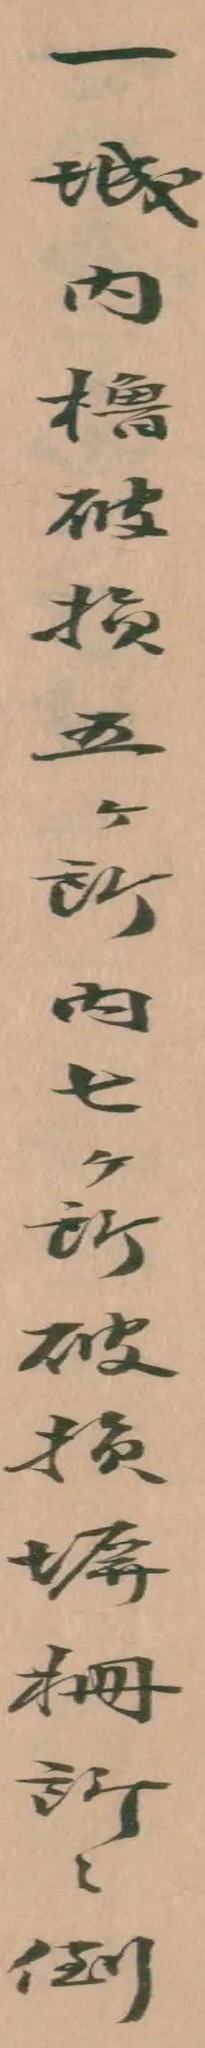一城内櫓破損五ヶ所内七ヶ所破損堀柵所々倒
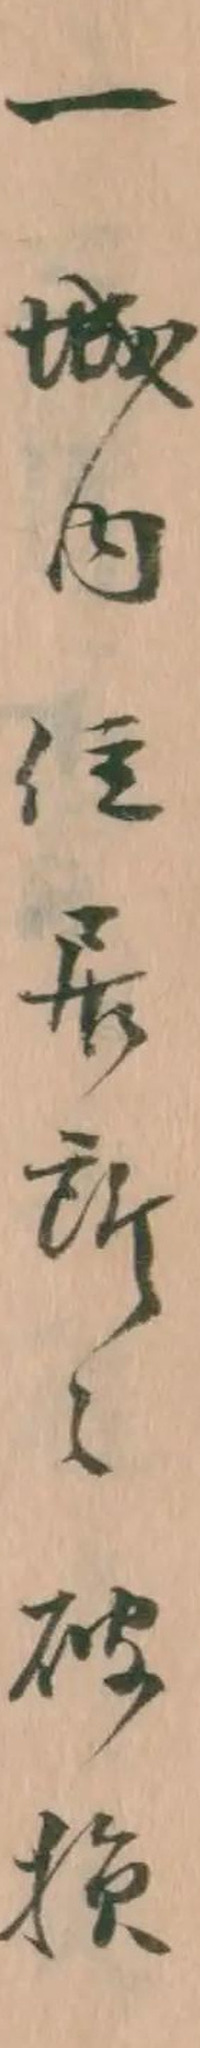一城内住居所々破損
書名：地災撮要. 巻3(地震之部)-巻4(噴火之部)
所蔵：国立国会図書館 National Diet Library, JAPAN
